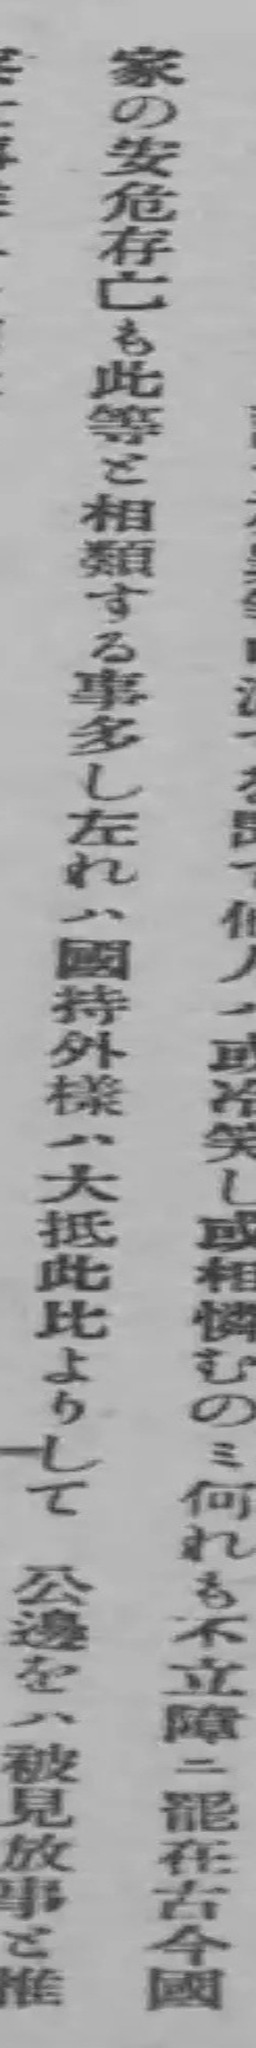家の安危存亡も此等と相類する事多し左れは国持外様ハ大抵此比よりして公辺をハ被見放事と推
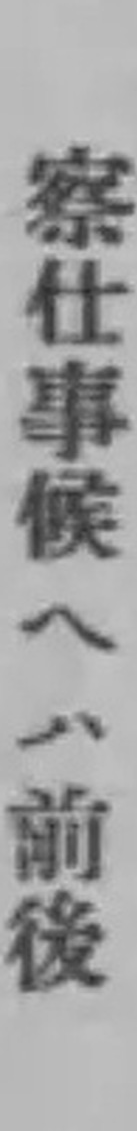察仕事候へハ前後
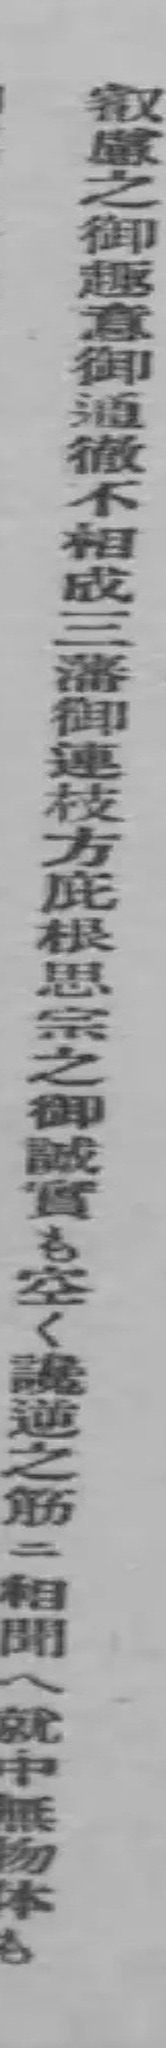叡慮之御趣意御通徹不相成三藩御連枝方庇根思宗之御誠実も空く讒逆之筋ニ相聞へ就中無物体も
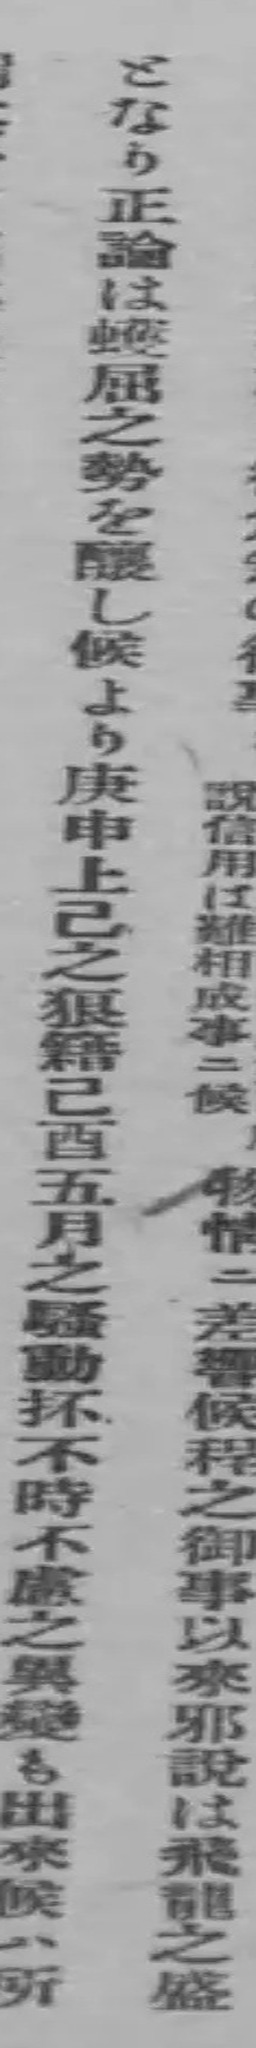となり正論は蠼屈之勢を醸し候より庚申上己之狼藉己酉五月之騒動抔不時不慮之異変も出来候ハ所
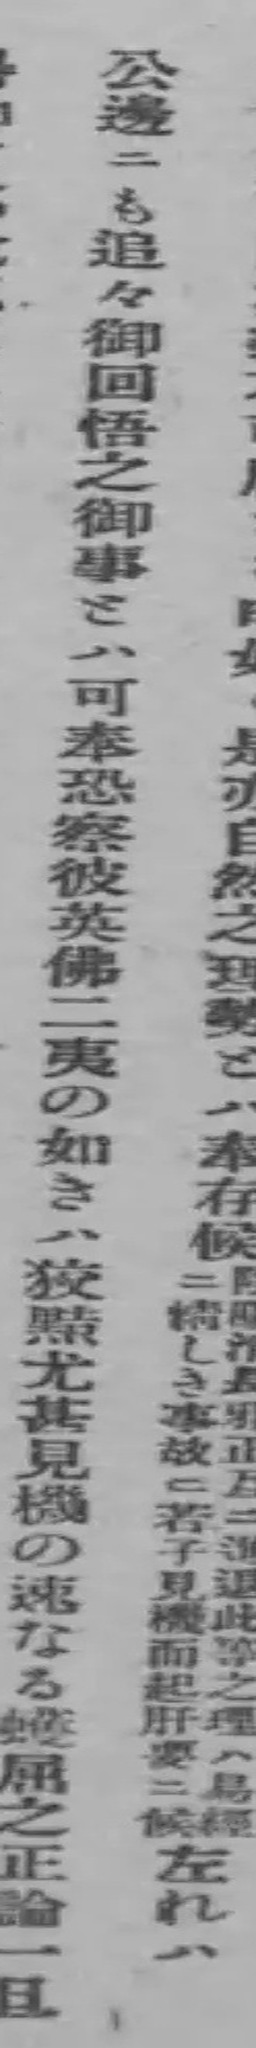公辺ニも追々御回悟之御事とハ可奉恐察彼英仏二夷の如きハ狡黠尤甚見機の速なる蠖屈之正論一旦
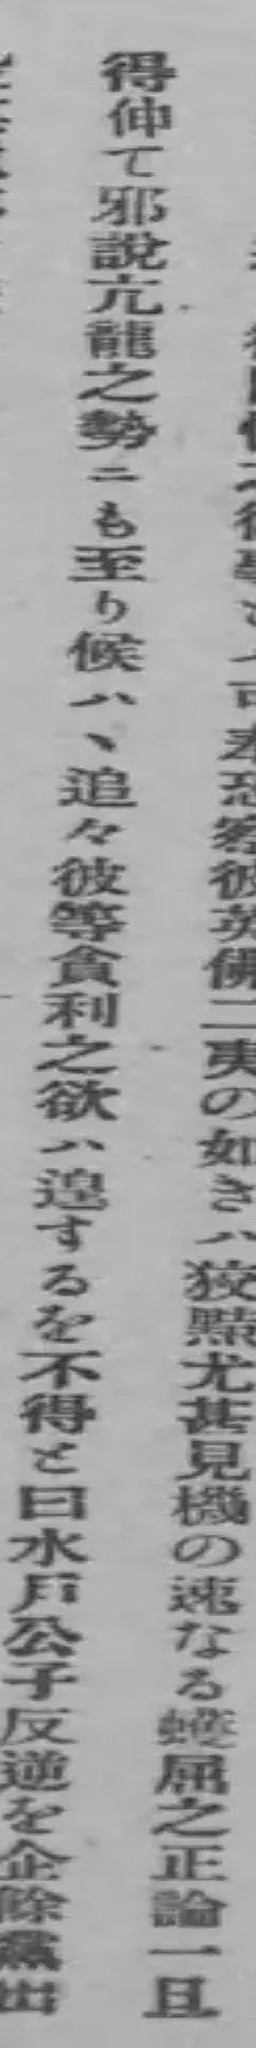得伸て邪説亢龍之勢ニも至り候ハヽ追々彼等貧利之欲ハ遑するを不得と曰水戸公子反逆を企余党出
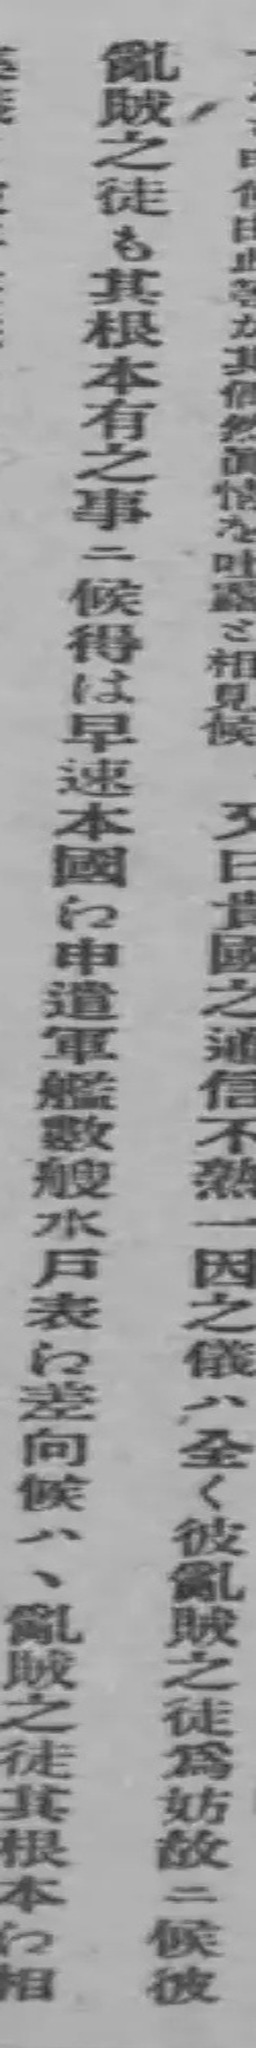乱賊之徒も其根本有之事ニ候得は早速本国え申遣軍艦数艘水戸表え差向候ハヽ乱賊之徒其根本え相
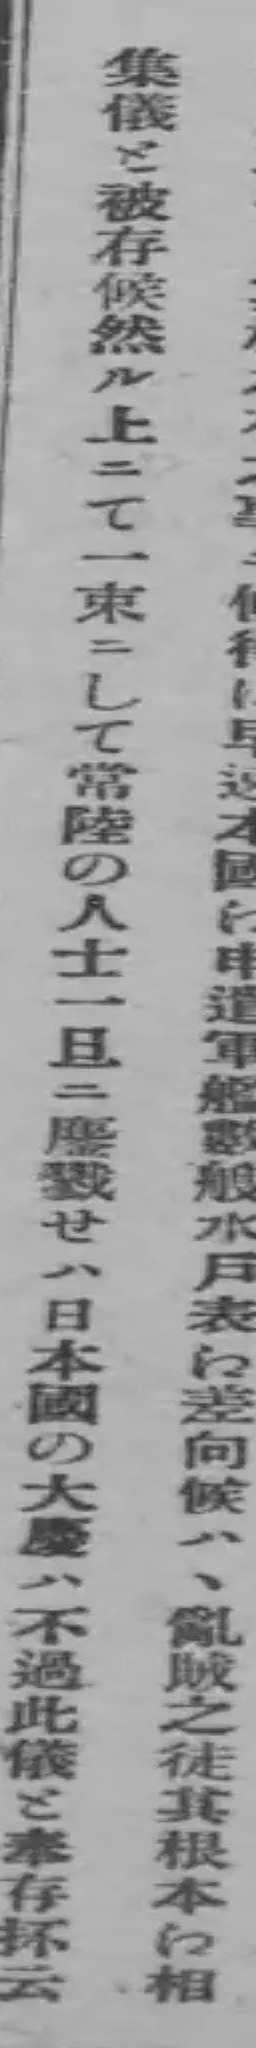集儀と被存候然ル上ニて一束ニして常陸の人士一旦ニ鏖戮せハ日本国の大慶ハ不過此儀と奉存抔云
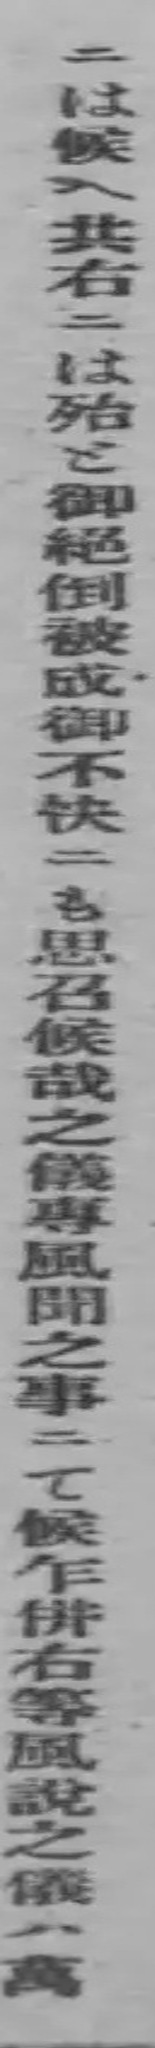ニは候へ共右ニは殆と御絶倒被成御不快ニも思召候哉之儀専風聞之事ニて候乍併右等風説之儀は万
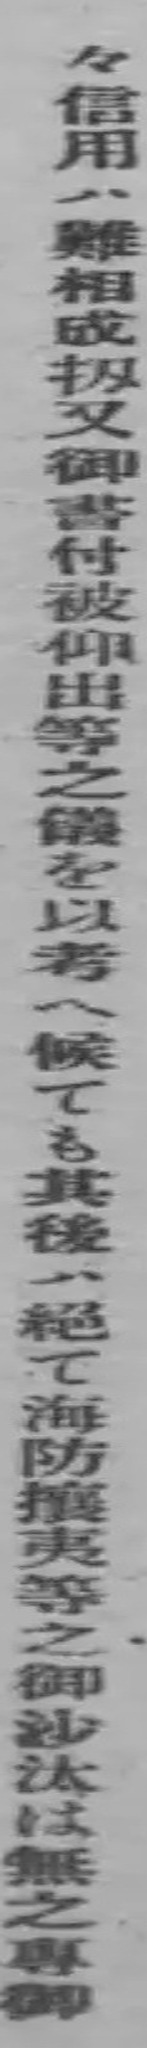々信用ハ難相成扨又御書付被仰出等之儀を以考へ候ても其後ハ絶て海防攘夷等之御沙汰は無之専御
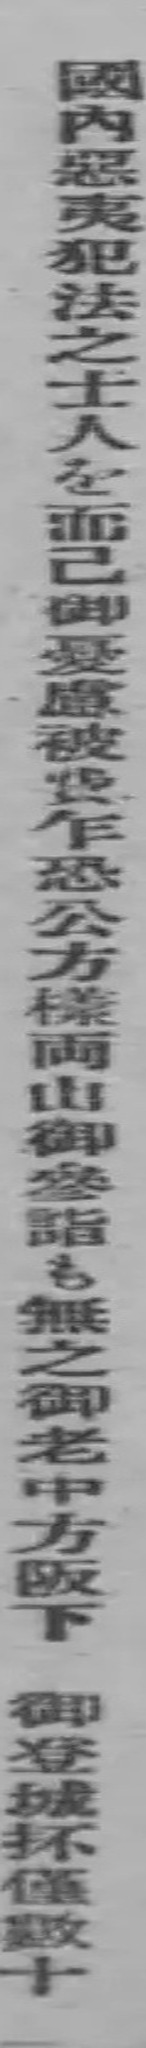国内悪夷犯法之士人を而己御憂慮被費乍恐公方様両山御参詣も無之御老中方阪下御登城抔僅数十
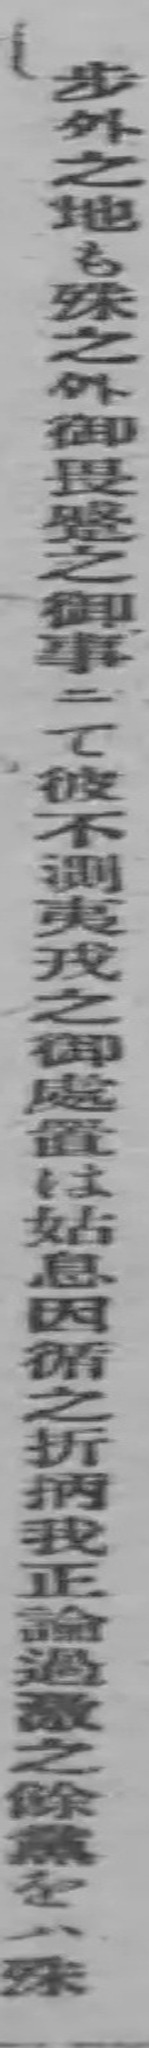歩外之地も殊之外御畏蹙之御事ニて彼不測夷戎之御処置は姑息因循之折柄我正論過激之余党をハ殊
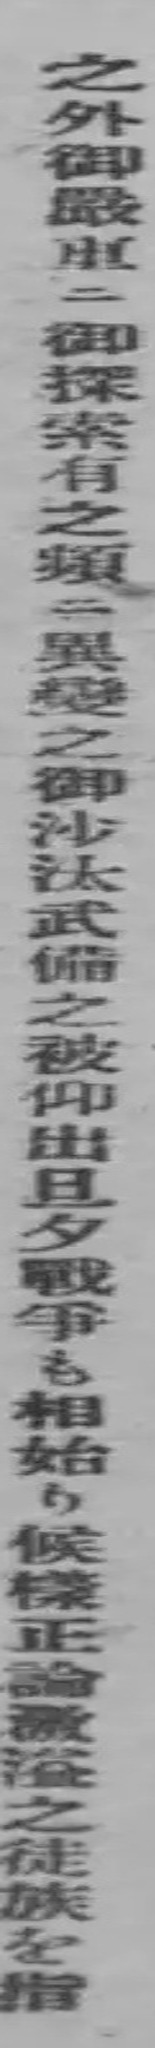之外御厳重ニ御探索有之頻ニ異変之御沙汰武備之被仰出旦夕戦争も相始候様正論激溢之徒族を指
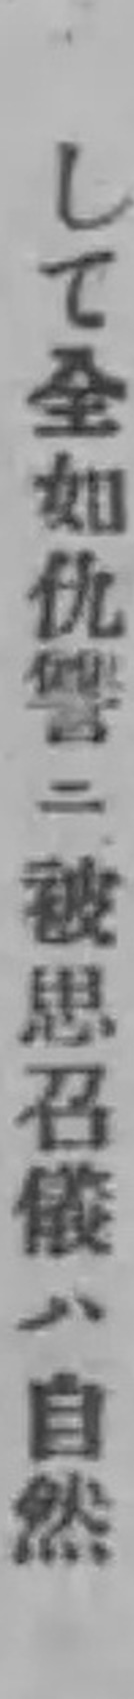して全如仇讐ニ被思召儀ハ自然
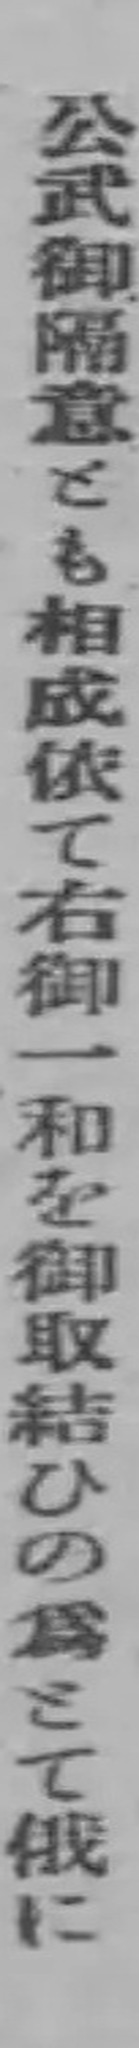公武御隔意とも相成依て右御一和を御取結ひの為とて俄に
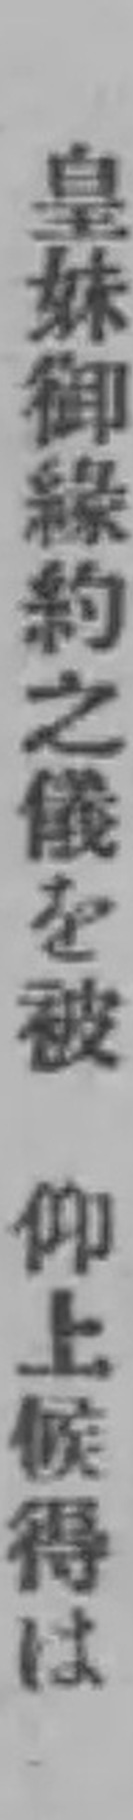皇妹御縁約之儀を被仰上候得は
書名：豊橋市史談
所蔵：国立国会図書館 National Diet Library, JAPAN
